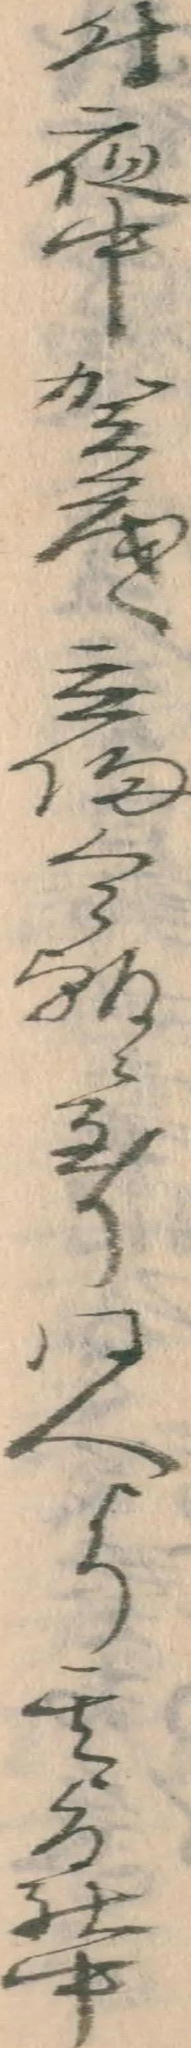付夜中賀茂へ立帰今朝ニ至り同人より其旨社中
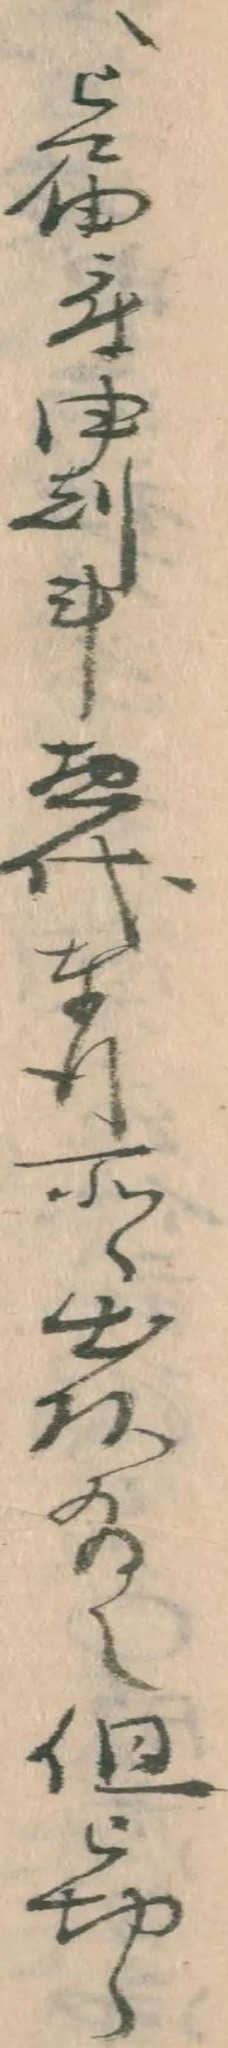へ被届ニ付申刻斗惣代奉行所へ出頭有之但被切候
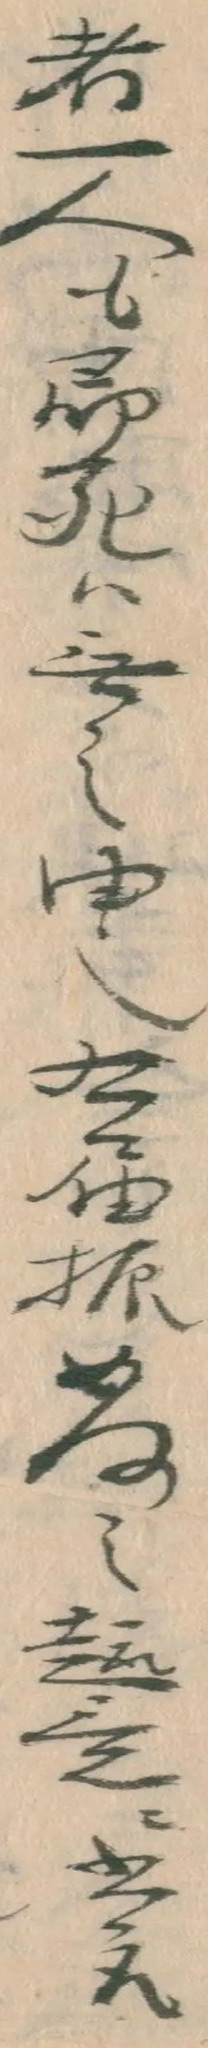者一人も即死ハ無之由也右届振如何之趣意ニ書取
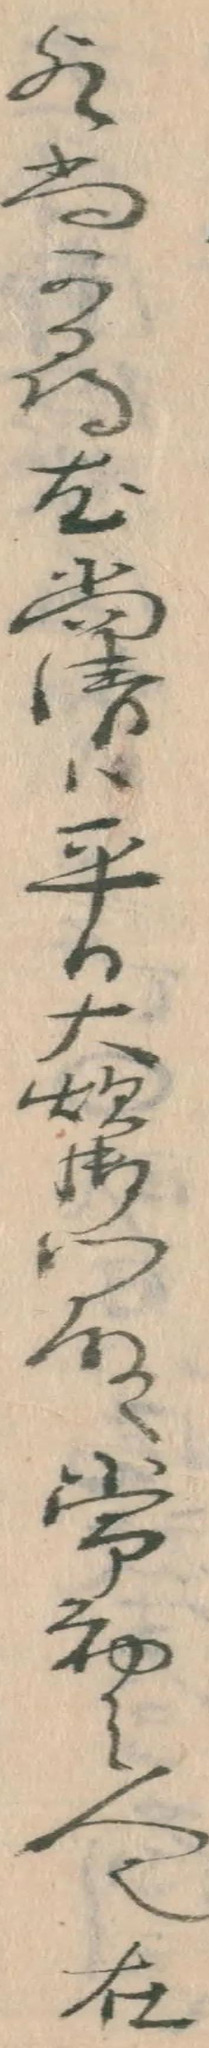歟尚可尋尤尚清は平日大炊御門殿へ常勤之人也在
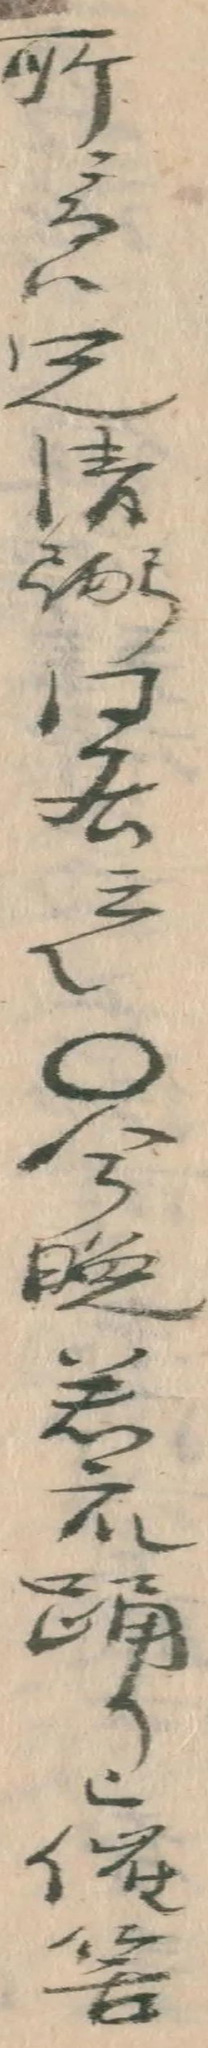所ニ而ハ兄清弼同居云々○今晩若衆踊り被催筈
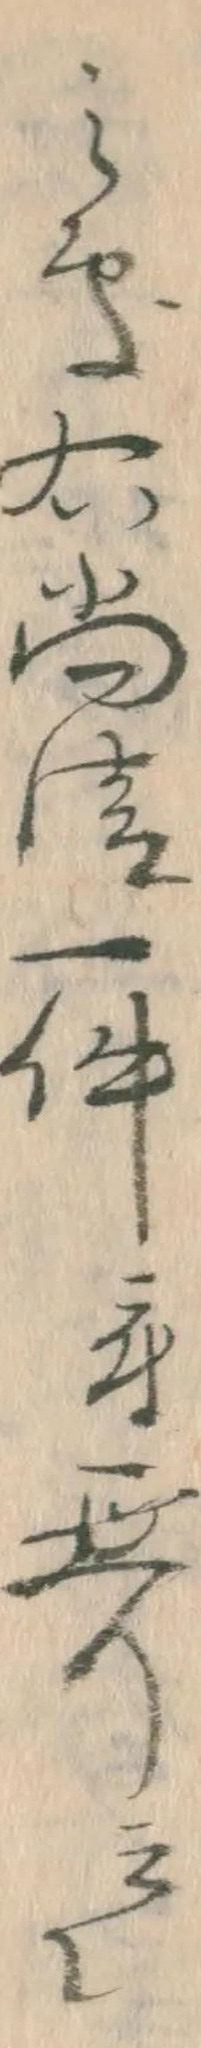之處右尚清一件ニ付延引云云々
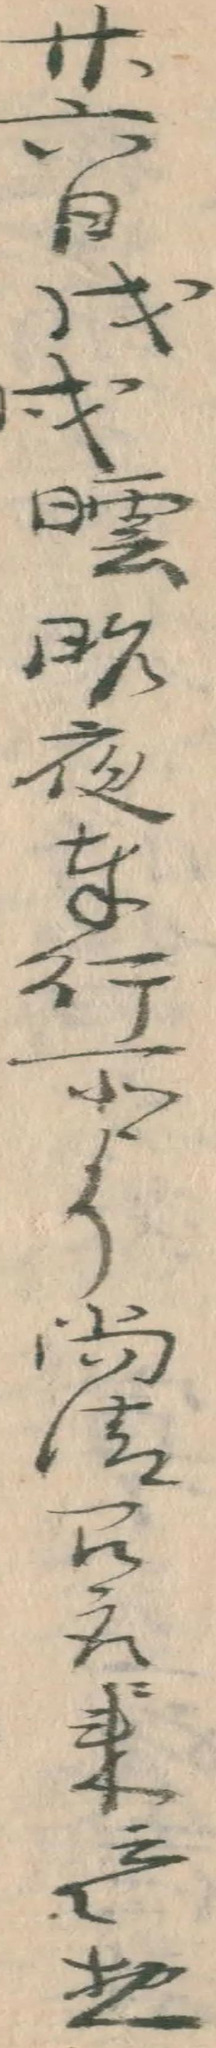廿六日戊戌曇昨夜奉行所より尚清召取に来云〻惣
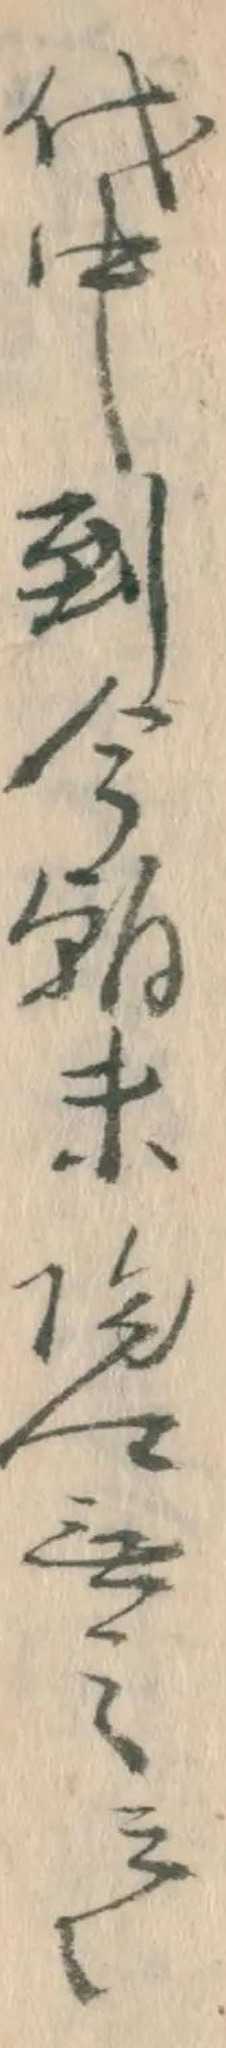代中到今朝未帰郷無之云々
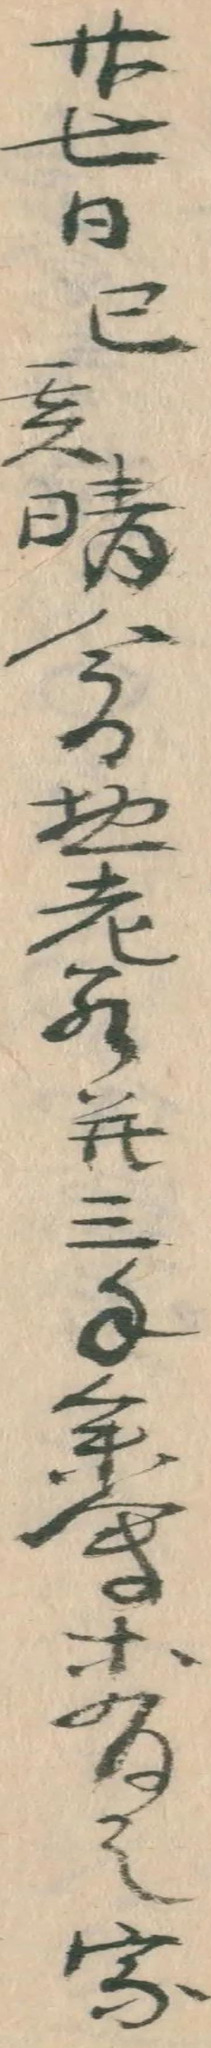廿七日己亥晴今日惣老若并三手参會等有之家
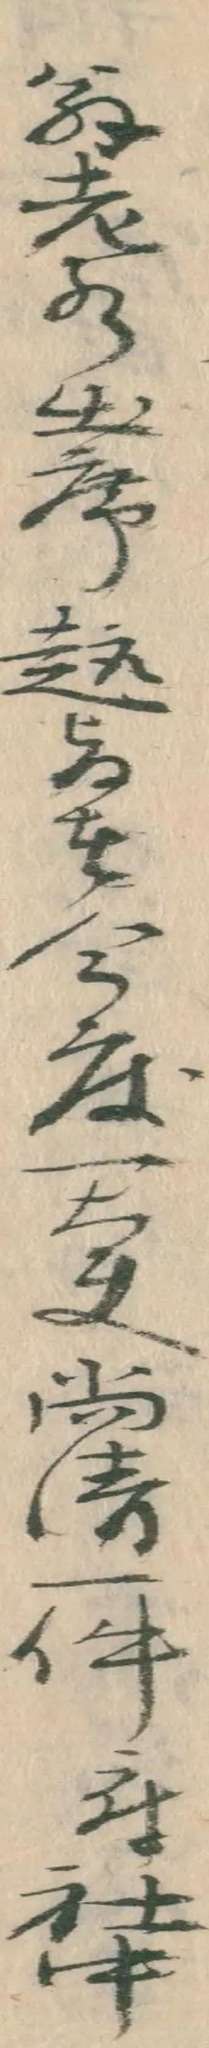翁老若出席趣旨在今度一大夫尚清一件ニ付社中
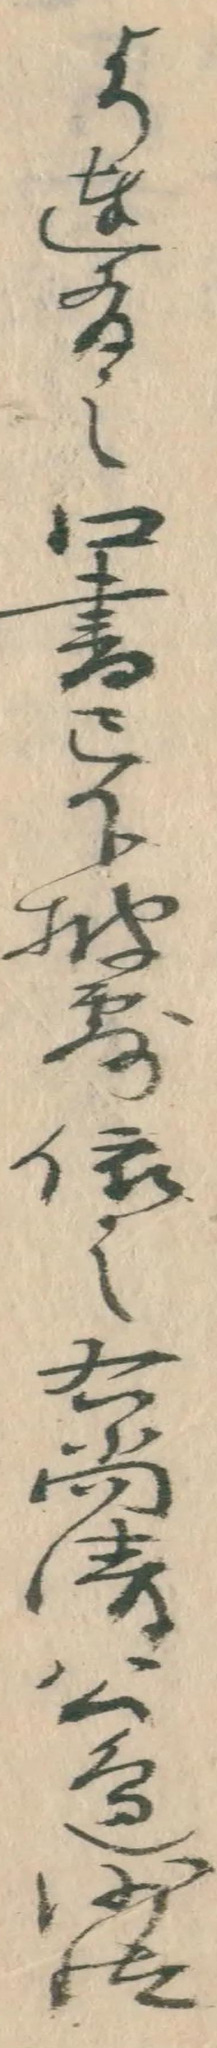より達有之口書已下披露依之右尚清公邉沙汰
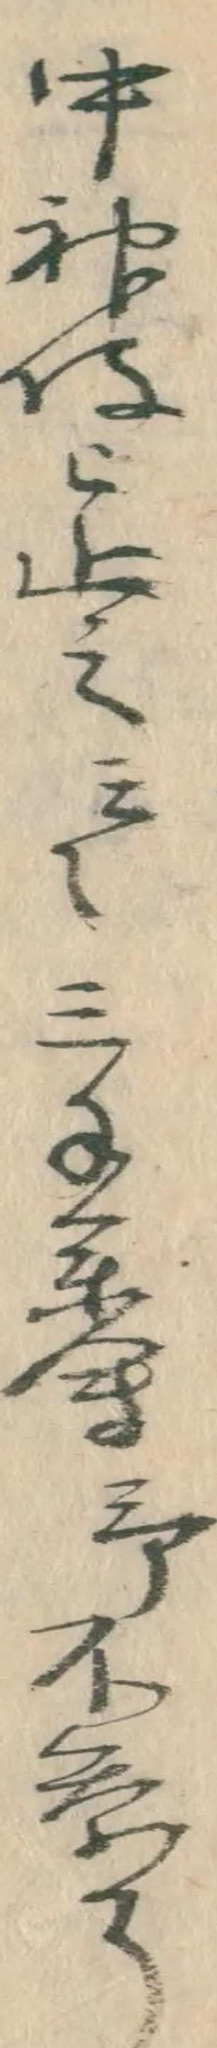中神役被止之云々三手参會予不参了
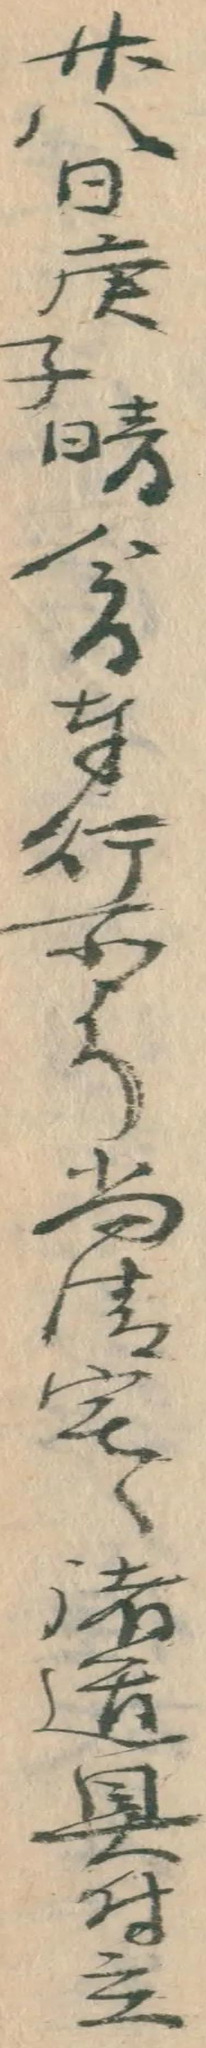廿八日庚子晴今日奉行所より尚清宅へ諸道具付立

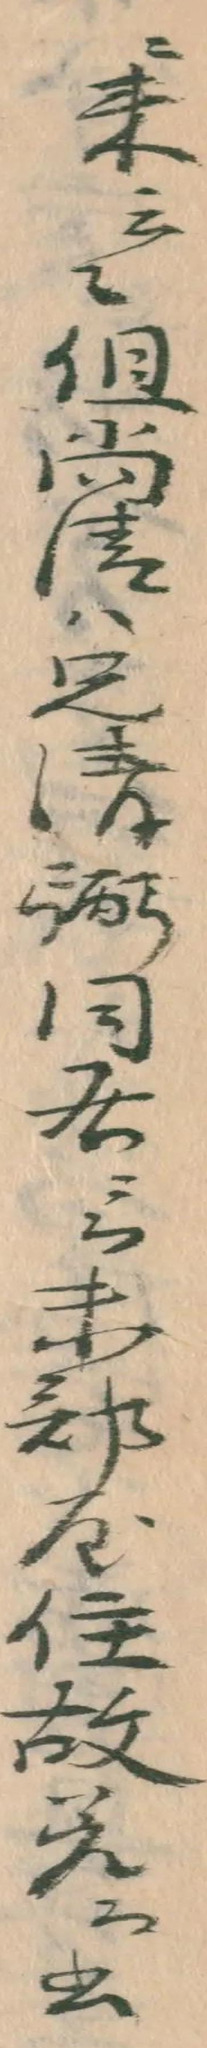に来云々但尚清ハ兄清弼同居ニ而未部屋住故差而書
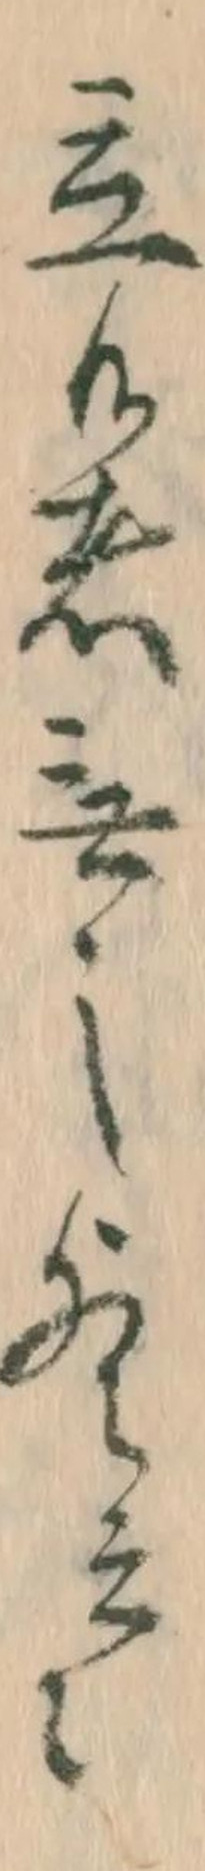立候者無之歟云々
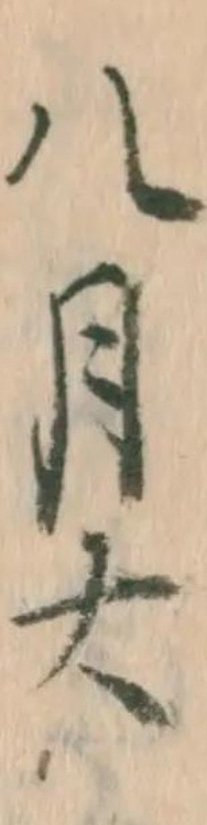八月大
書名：賀茂社記録. 第63冊
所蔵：国立国会図書館 National Diet Library, JAPAN
